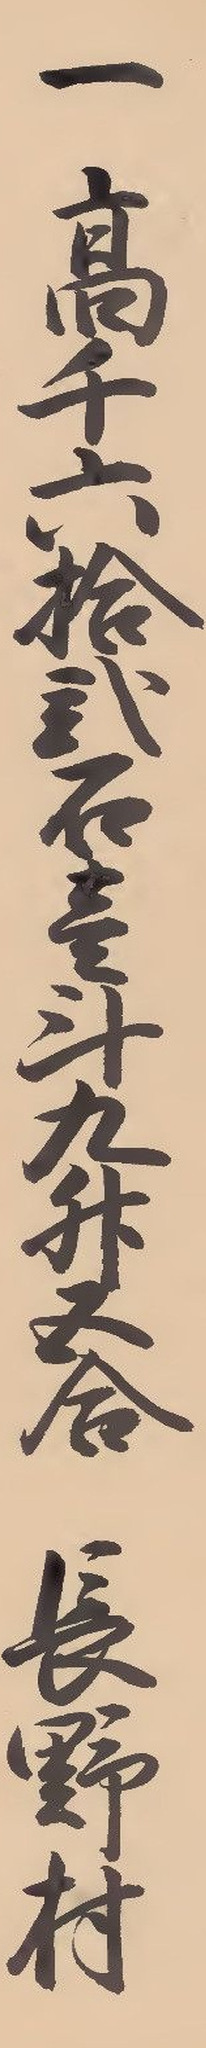一高千六拾弐石壱斗九升五合長野村
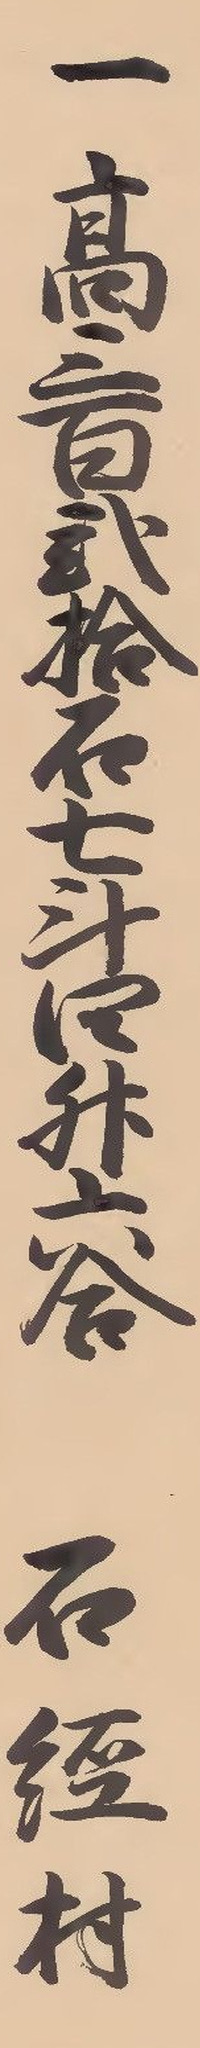一高三百弐拾石七斗四升六合石経村
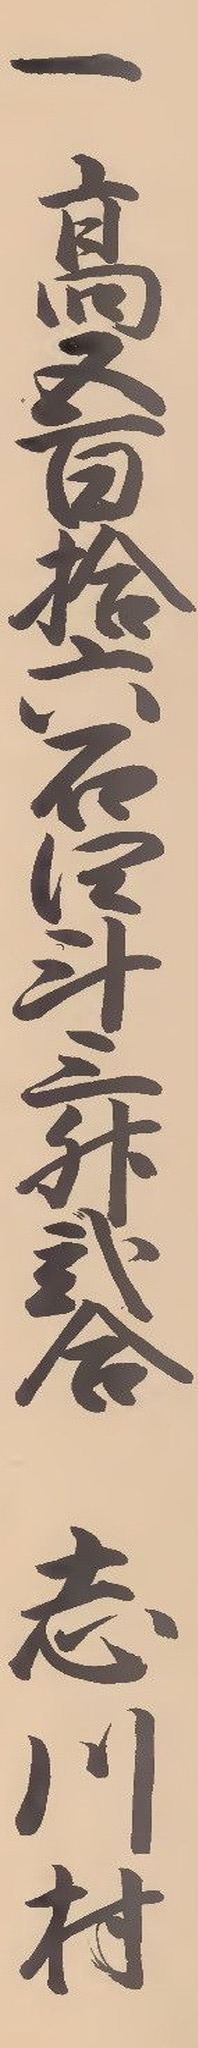一高五百拾六石四斗三升弐合志川村
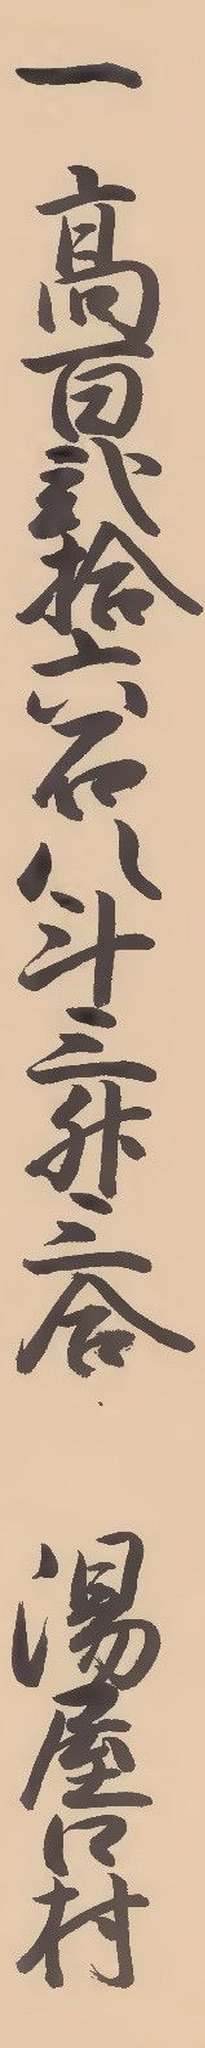一高百弐拾六石八斗三升三合湯屋口村
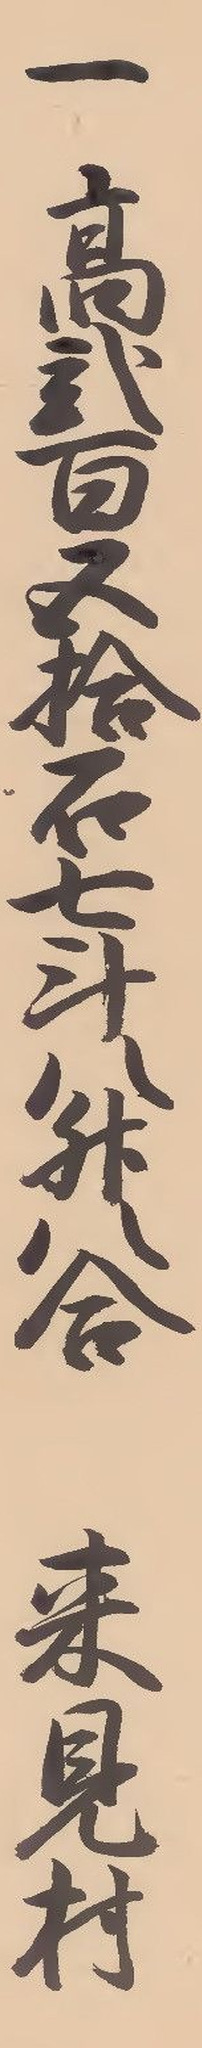一高弐百五拾石七斗八升八合来見村
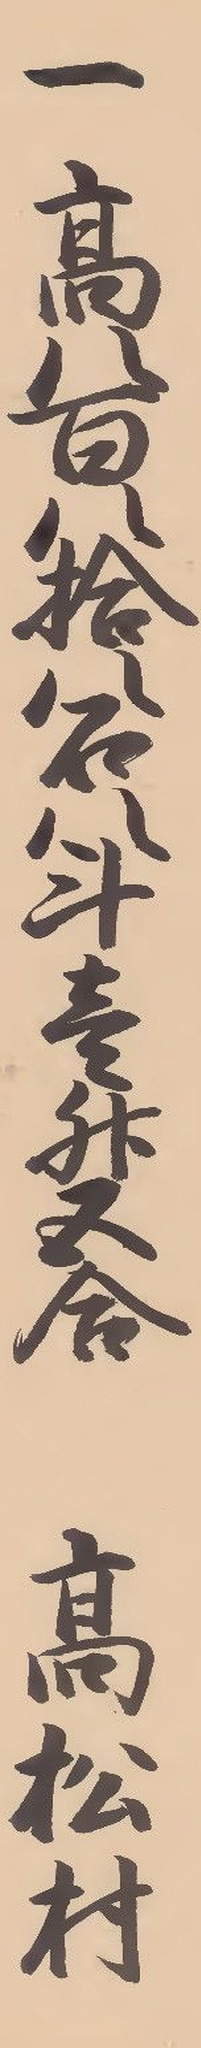一高八百八拾八石八斗壱升五合高松村

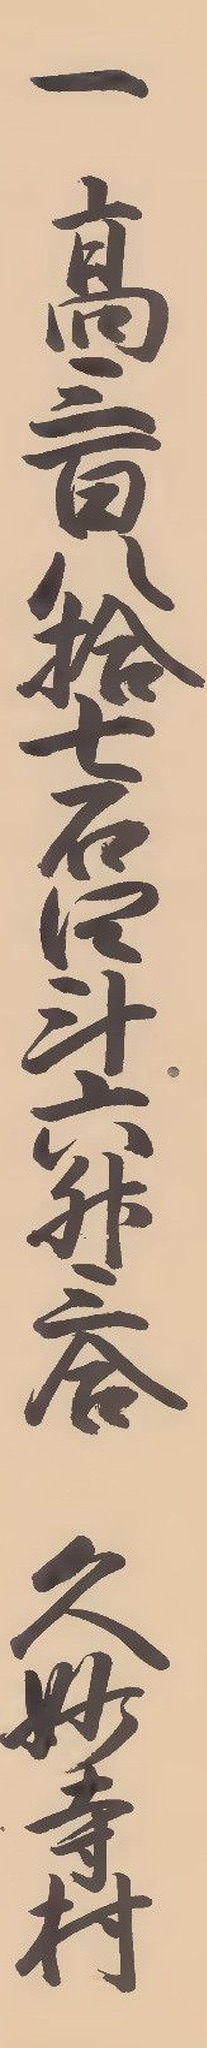一高三百八拾七石四斗六升三合久妙寺村
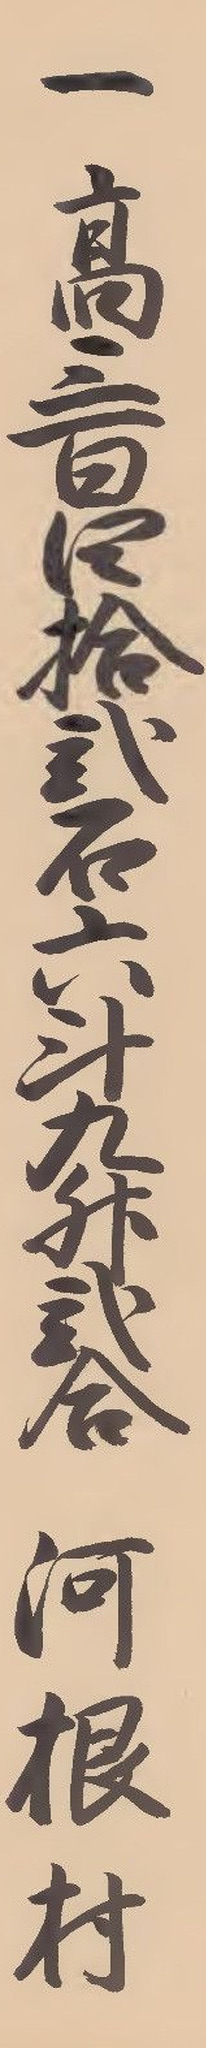一高三百四拾弐石六斗九升弐合河根村
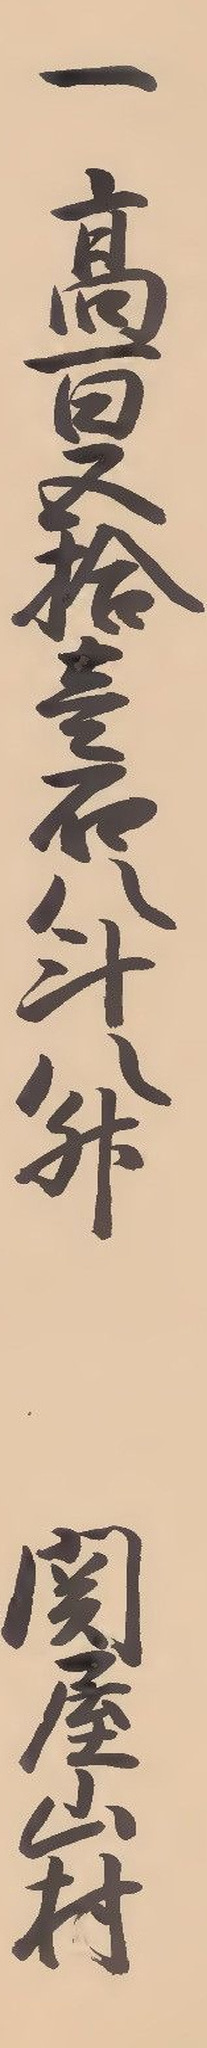一高百五拾壱石八斗八升関屋山村
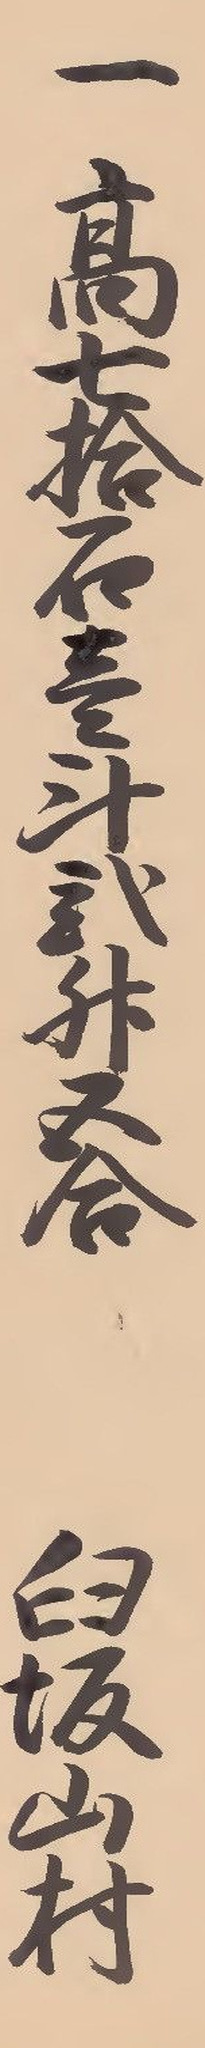一高七拾石壱斗弐升五合臼坂山村
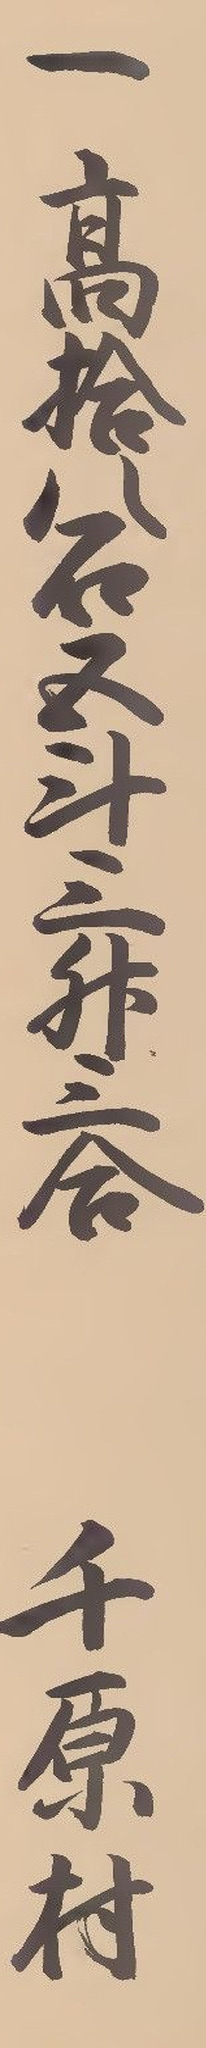一高拾八石五斗三升三合千原村

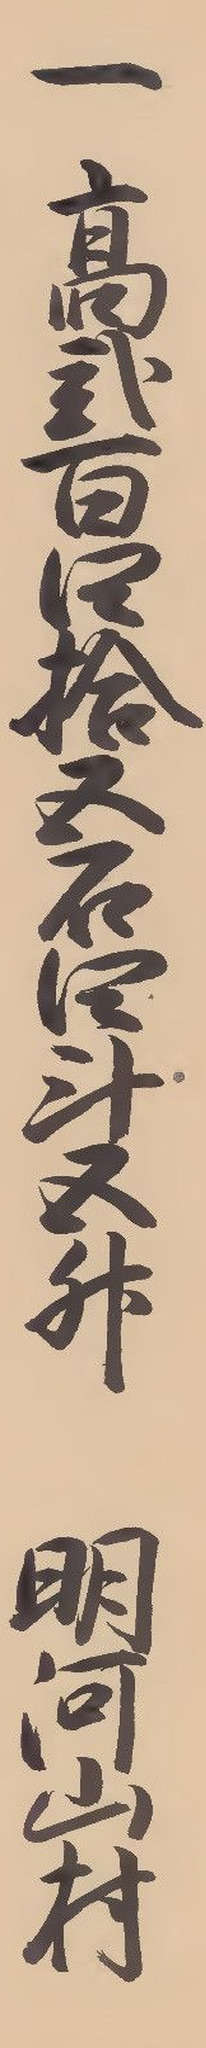一高弐百四拾五石四斗五升明河山村
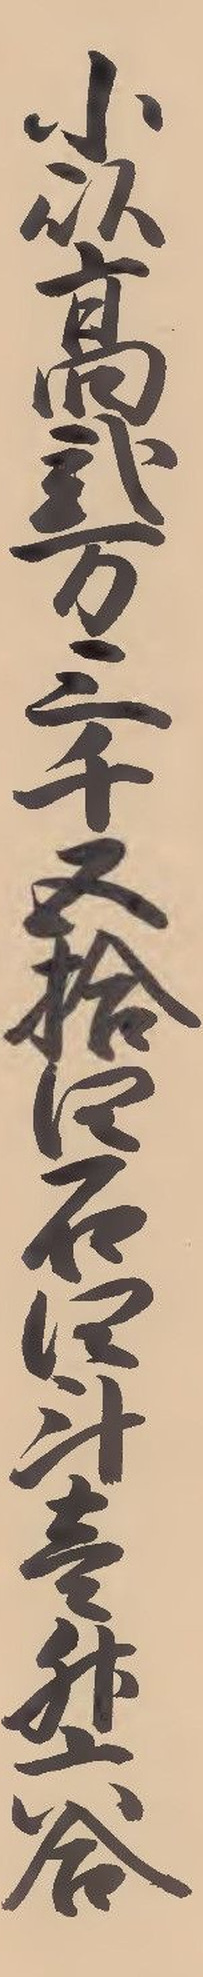小以高弐万三千五拾四石四斗壱升六合
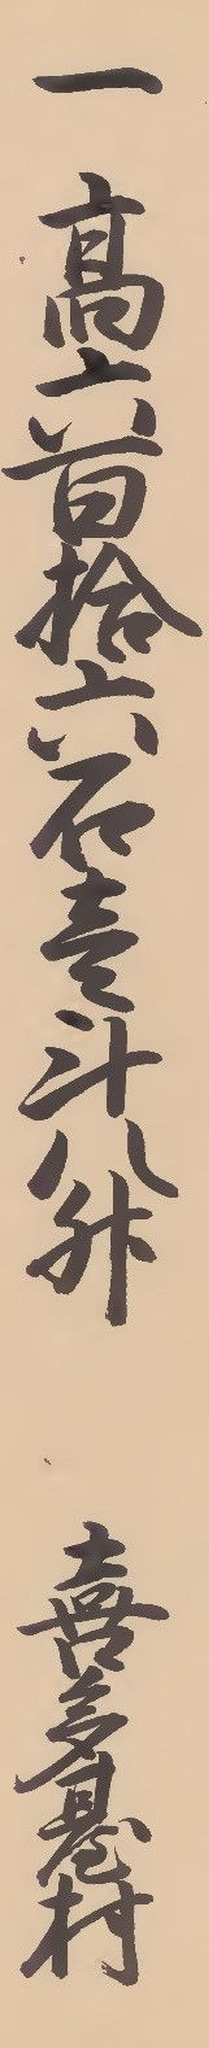一高六百拾六石壱斗八升喜多台村
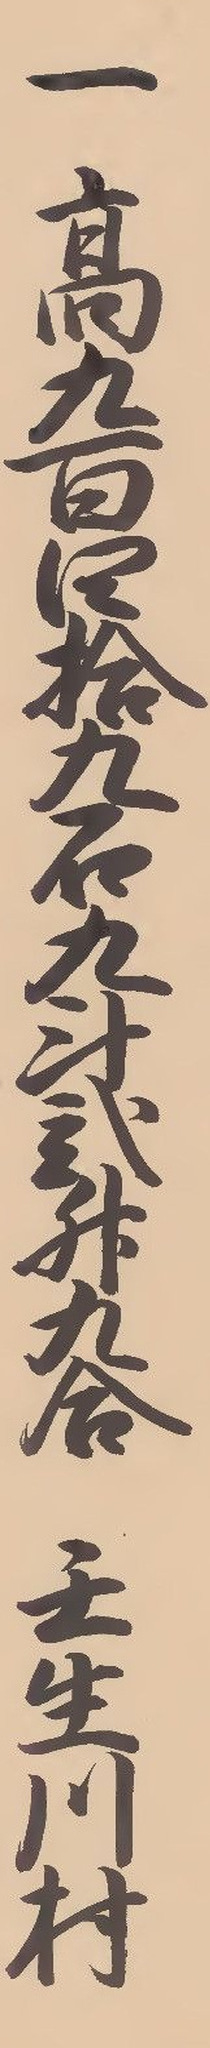一高九百四拾九石九斗弐升九合壬生川村

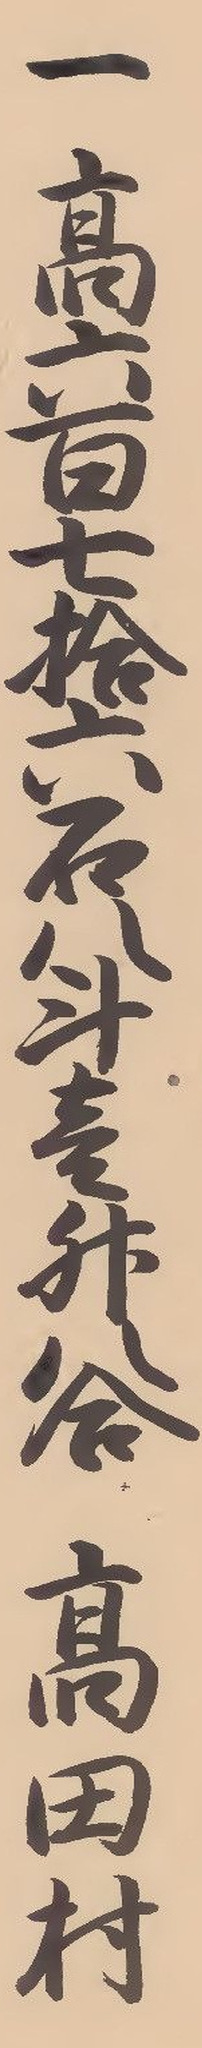一高六百七拾六石八斗壱升八合高田村
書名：伊予国郷帳
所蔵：国立公文書館 National Archives of Japan
